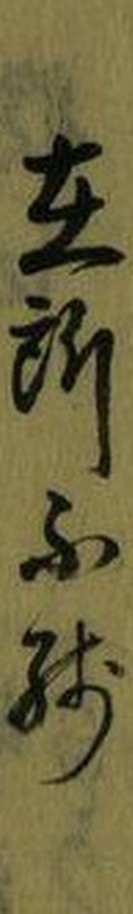在所不残
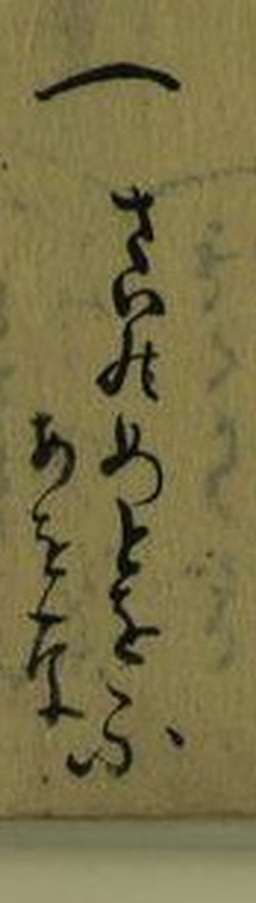あをな
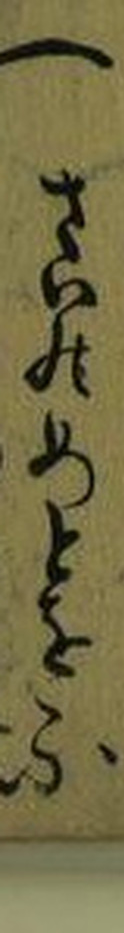汁さいのめとをふ
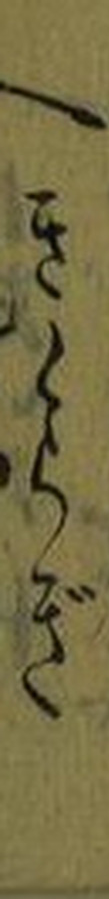坪きくらぎ
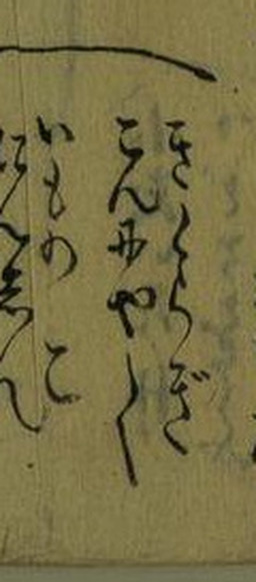こんにやく
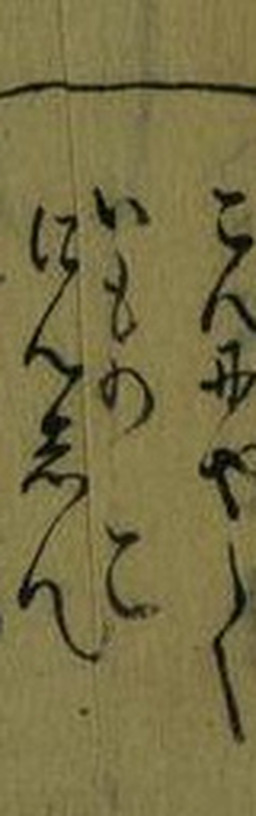にんしん
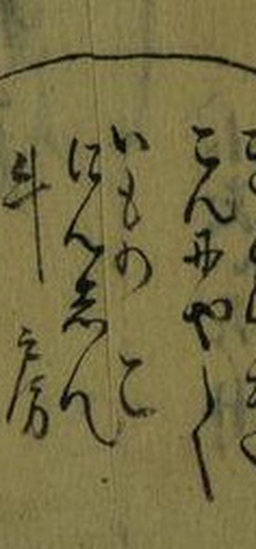いものこ
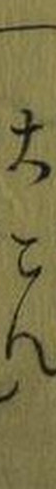大こん
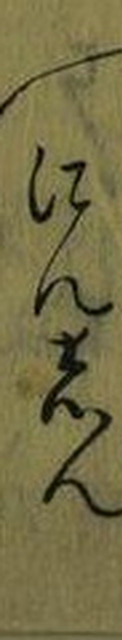にんしん
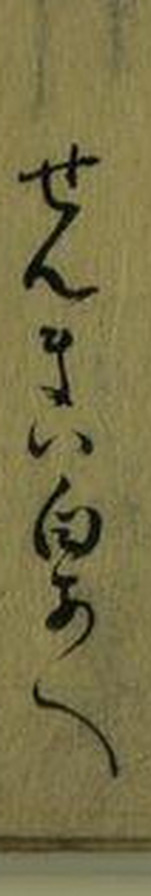せんまい白あへ
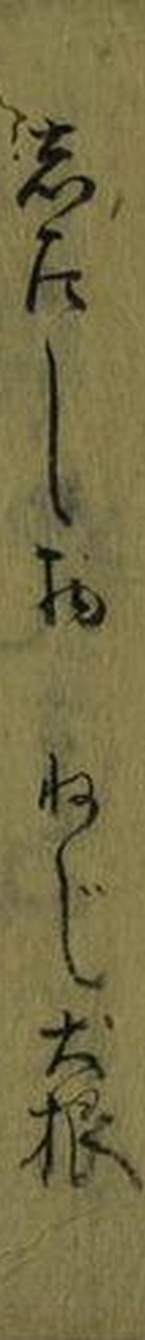したし物ねじ大根

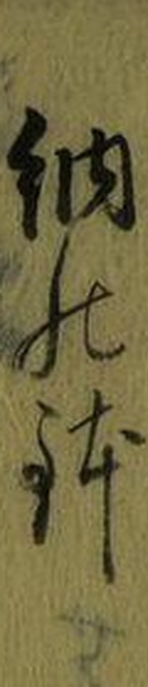納の鉢
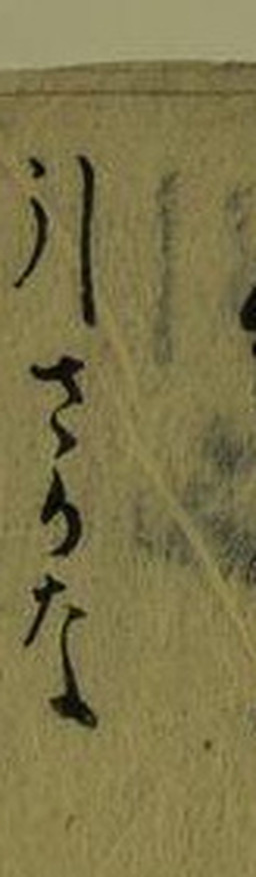引さかな
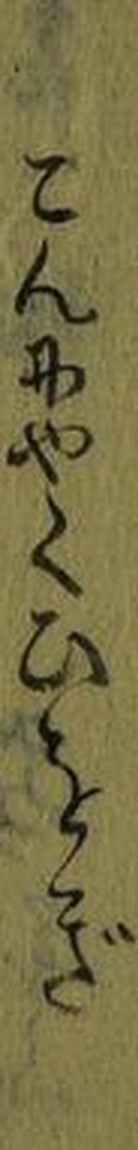こんにゃくひをぎ
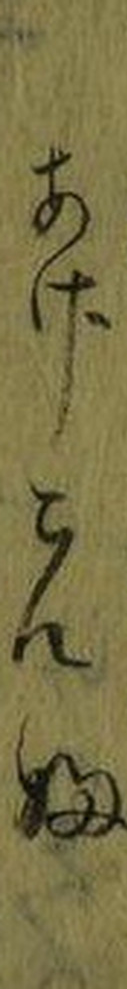あげこんふ
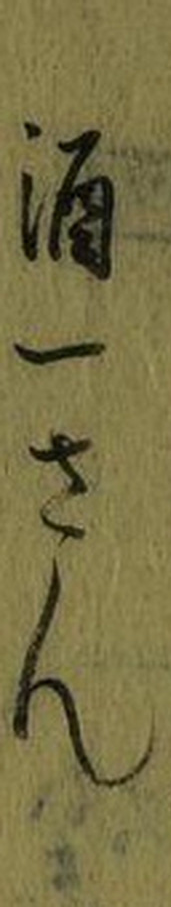酒一さん
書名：（献立覚）
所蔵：福井県文書館 Fukui Prefectural Archives
